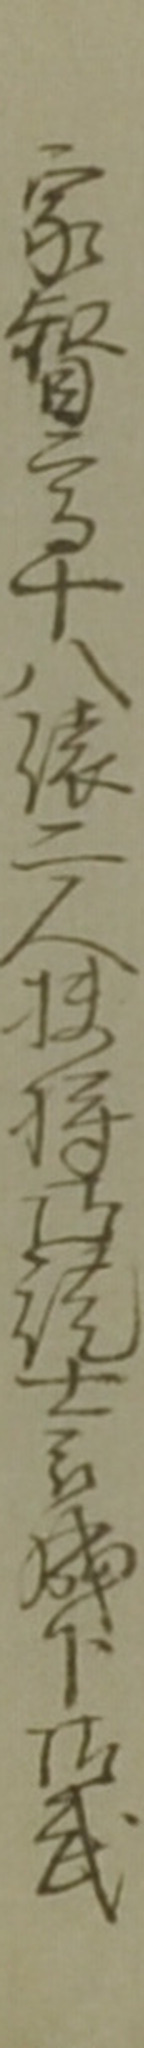家督高十八俵二人扶持御徒士被成下御武
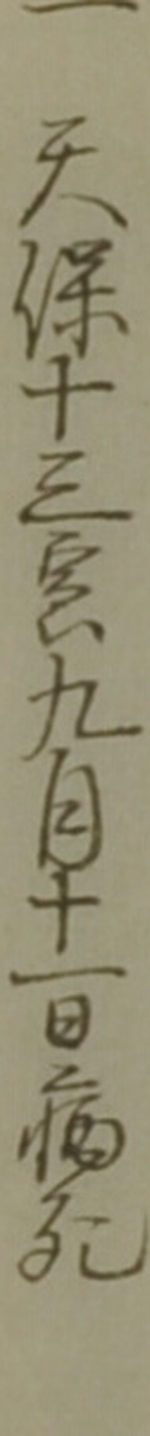一天保十三寅九月十一日病死
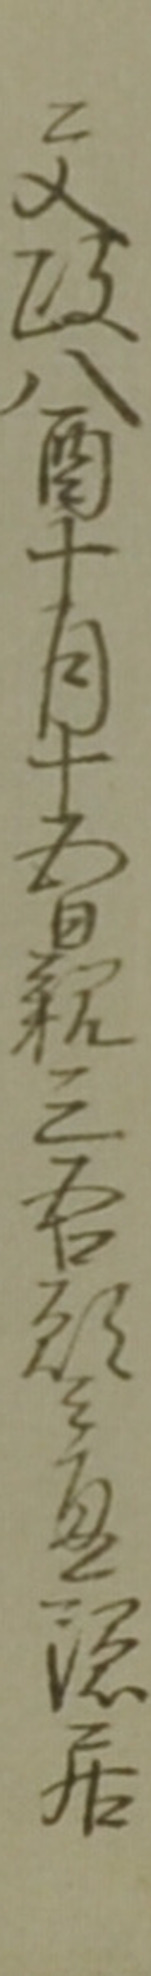一文政八酉十月十五日親三吾願之通隠居
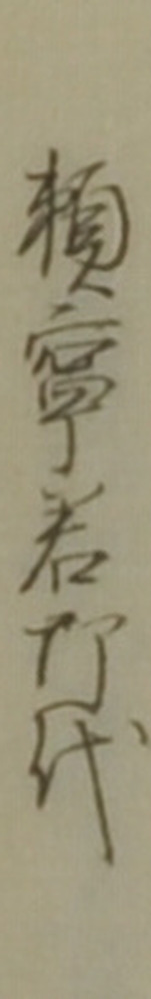頼寧君御代
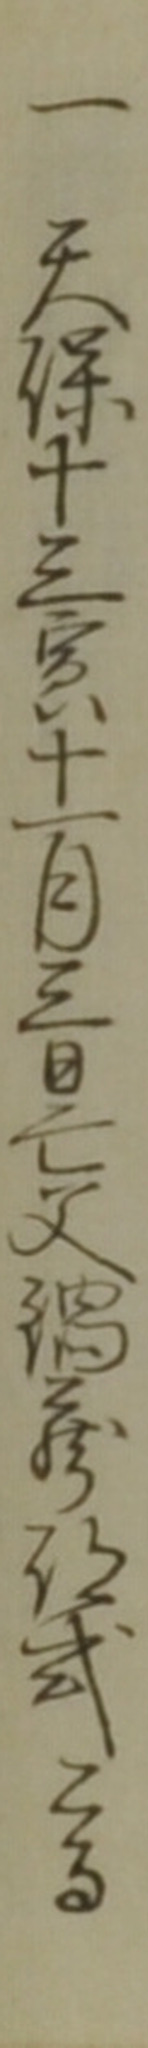一天保十三寅十一月三日亡父鍋蔵跡式高
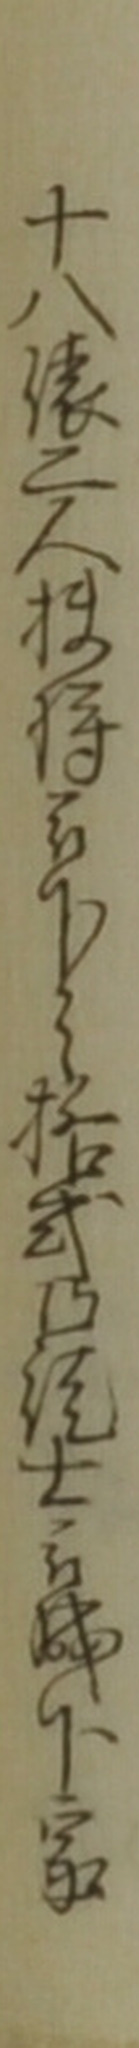十八俵二人扶持被下之格式御徒士被成下家
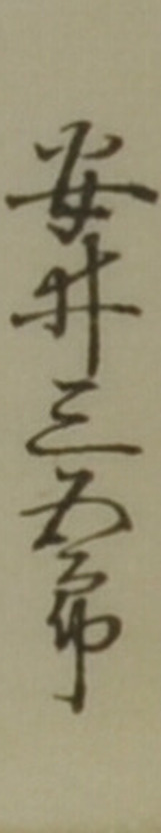安井三五郎

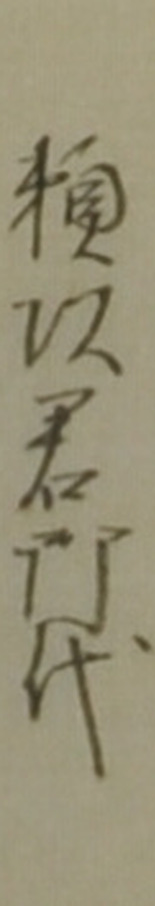頼以君御代
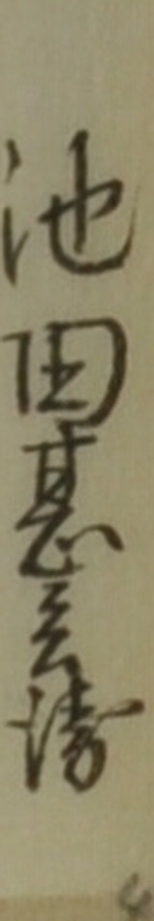池田甚兵衛
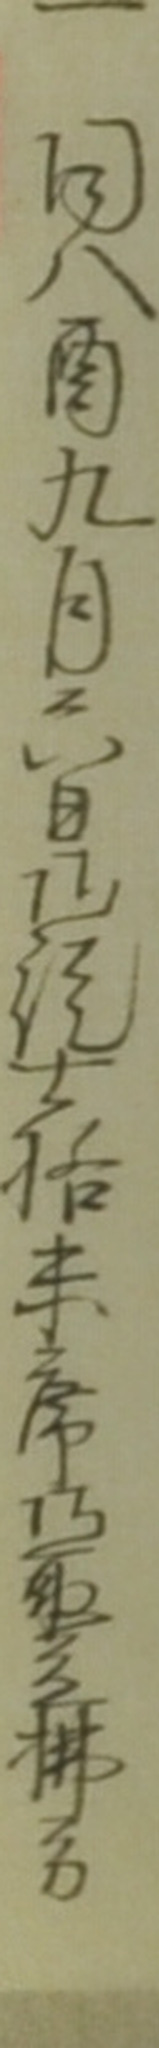一同八酉九月六日御徒士格末席御取立払方

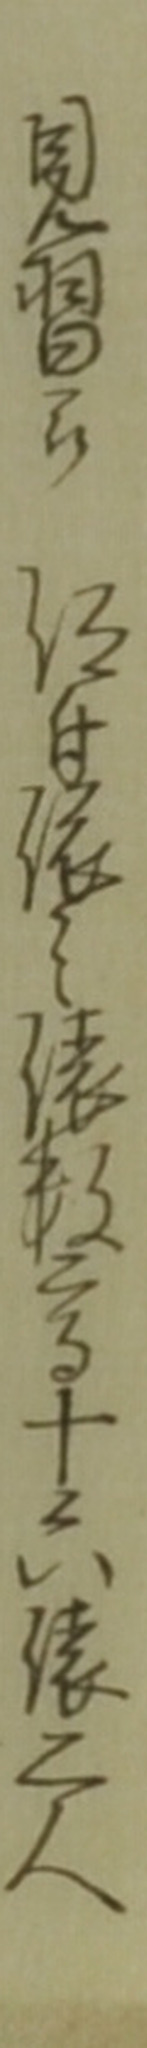見習被仰付依之俵数高十六俵二人
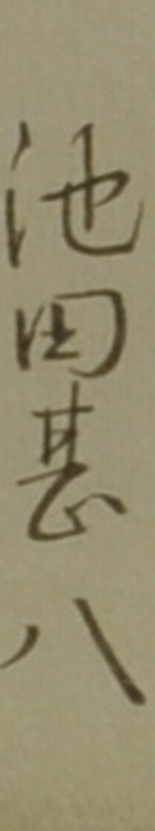池田甚八

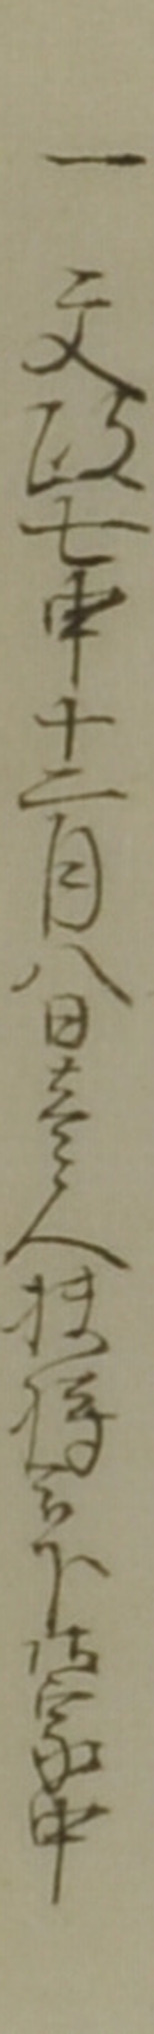一文政七申十二月八日壱人扶持被下御家中
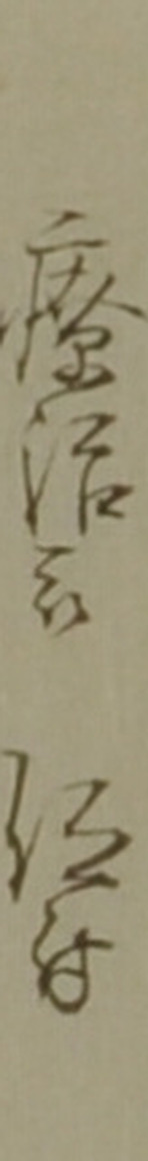療治被仰付
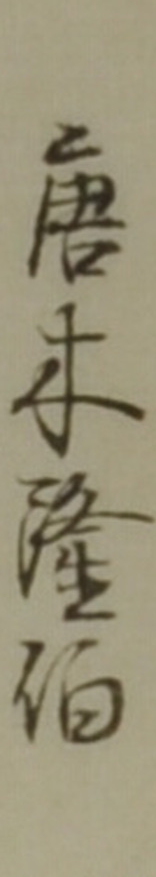唐木隆伯
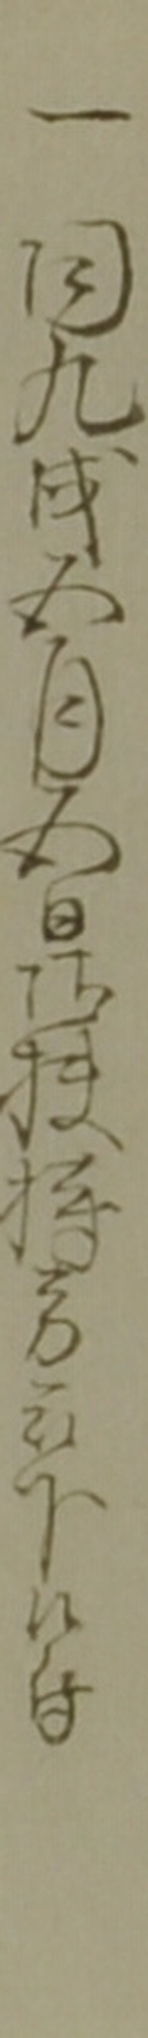一同九戌五月五日御扶持方被下候付
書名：無足諸士勤仕録（六）
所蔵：伊那市立高遠町図書館・合同会社AMANE
